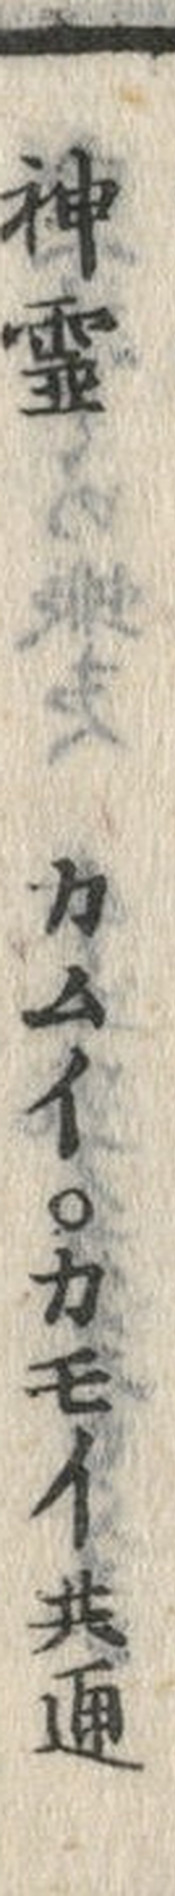神霊カムイ○カモイ共通
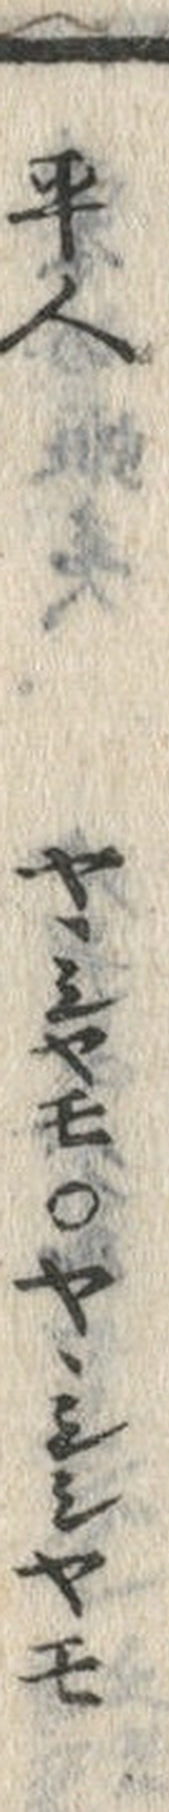平人ヤヽシヤモ○ヤヽシシヤモ
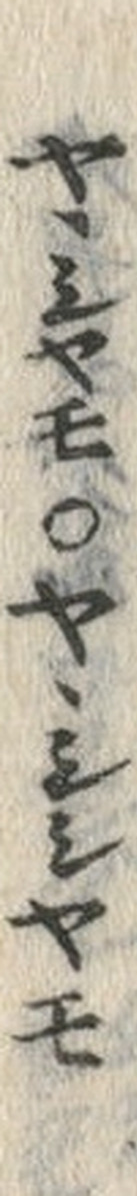平人ヤヽシヤモ○ヤヽシシヤモ
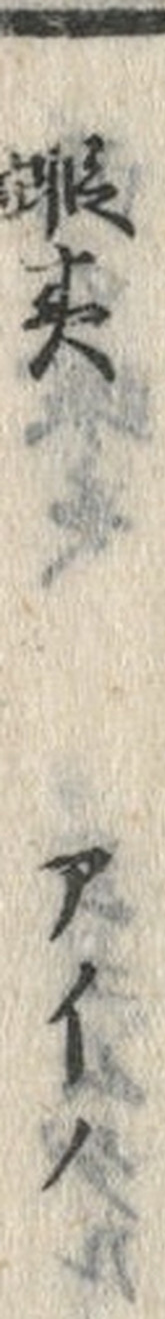蝦夷アイノ
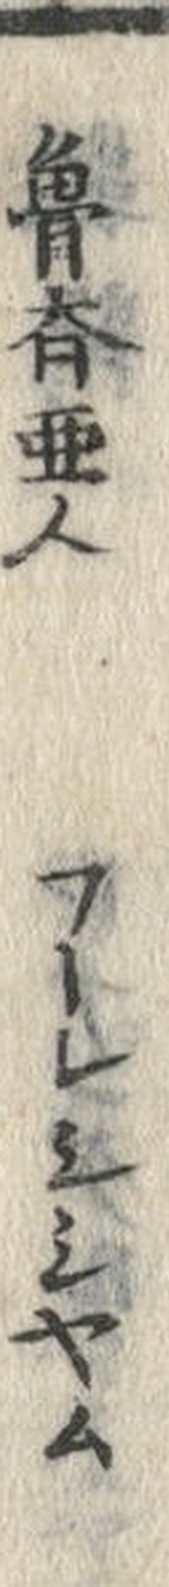魯斉亜人フーレシシヤム
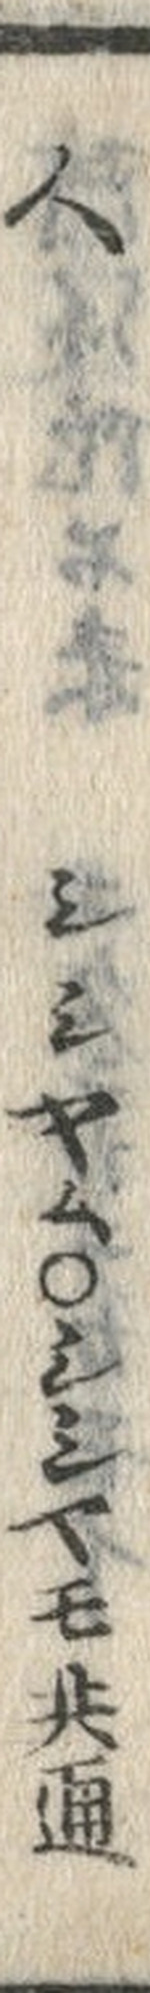人シシヤム○シシヤモ共通
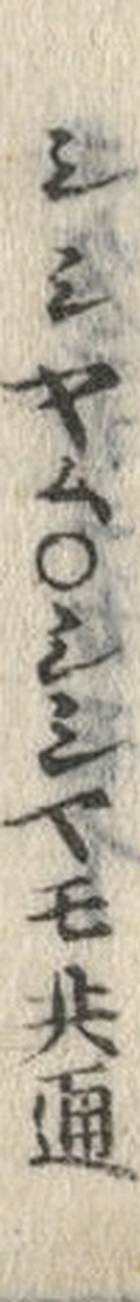人シシヤム○シシヤモ共通
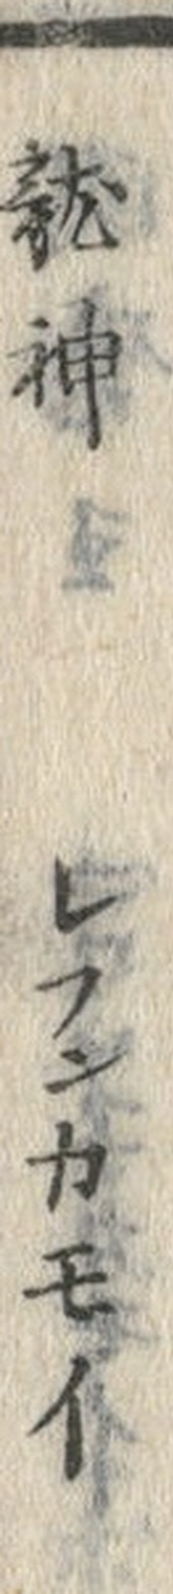竜神レフンカモイ

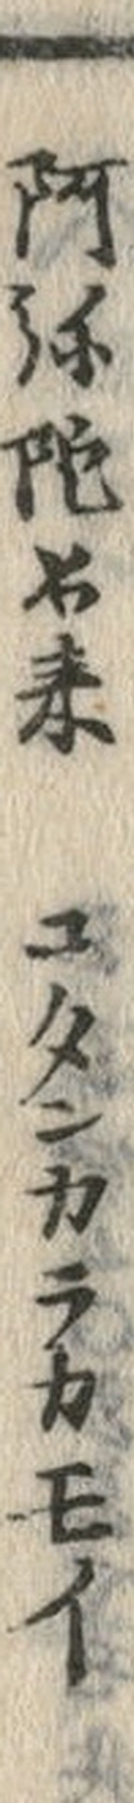阿弥陀如来コタンカラカモイ
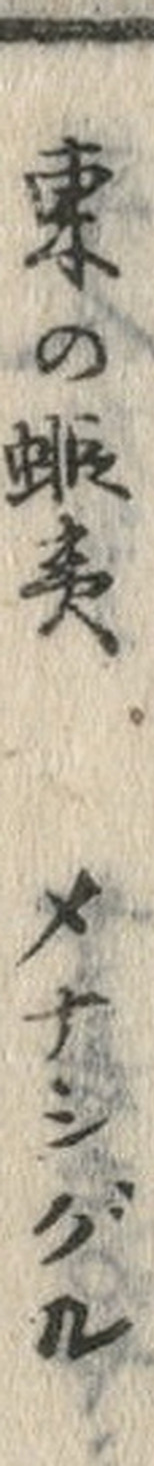東の蝦夷メナシグル
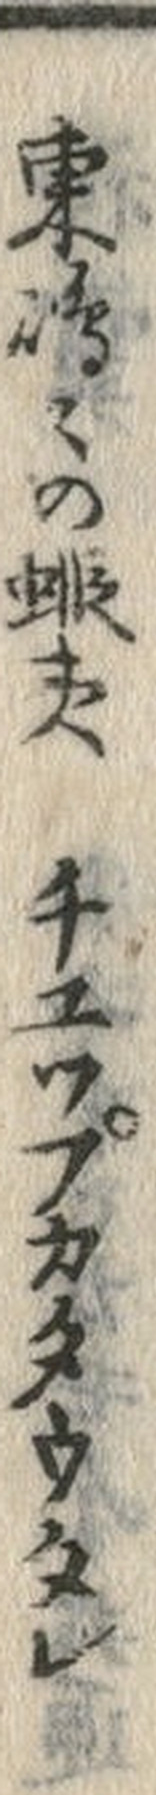東島々の蝦夷チユツプカタウタレ
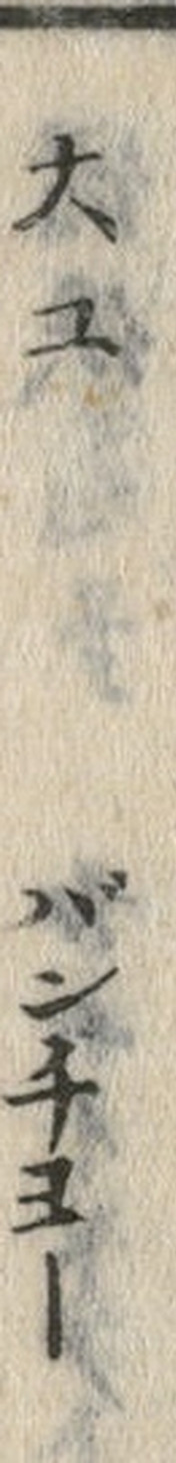大工パンチヨー
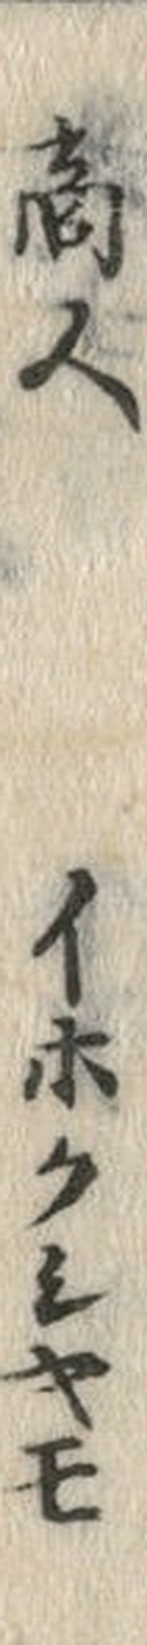商人イホクシヤモ
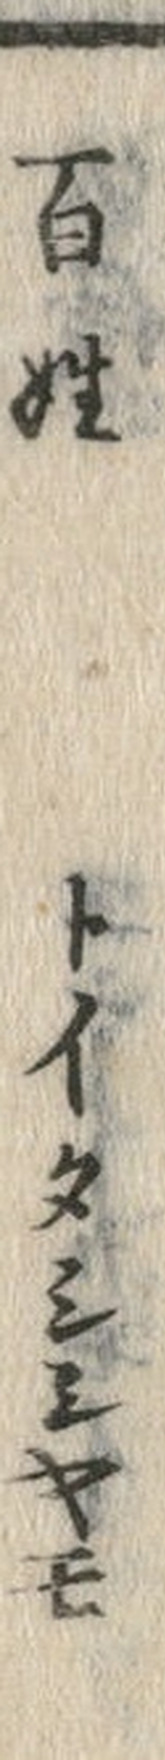百姓トイタシシヤモ
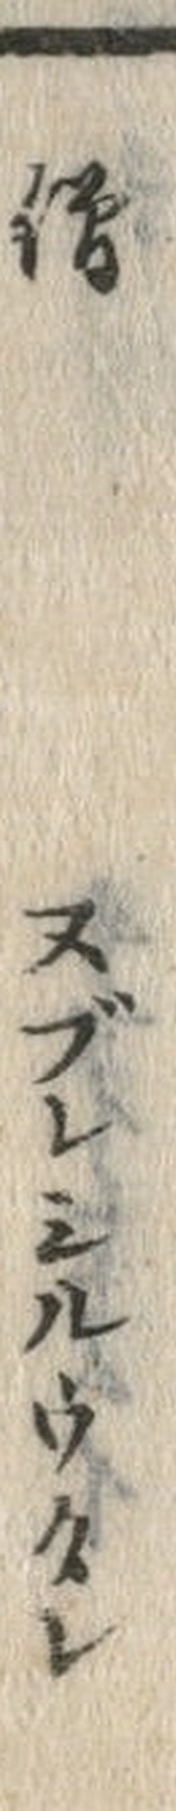僧ヌブレシルウタレ
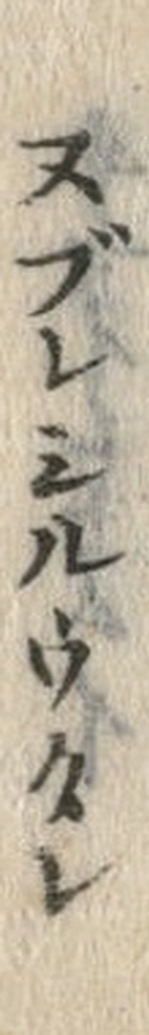僧ヌブレシルウタレ
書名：蝦夷方言藻汐草　乾巻
